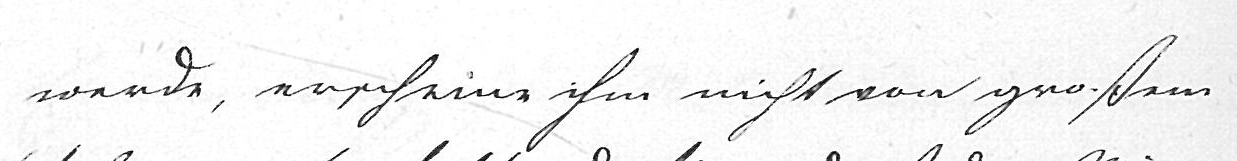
werde, erscheine ihm nicht von großem
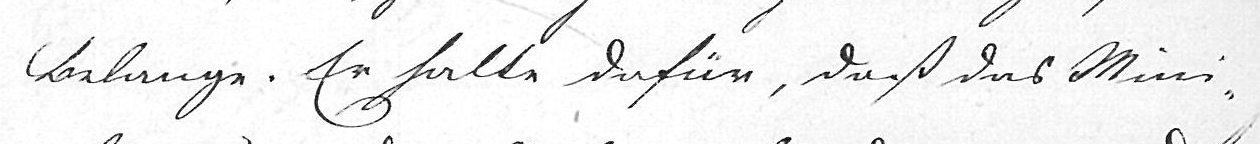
Belange. Er halte dafür, daß das Mini-
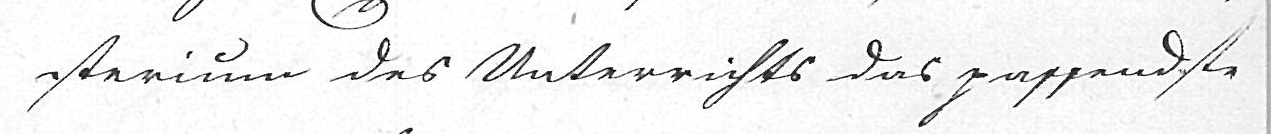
sterium des Unterrichts das passendste
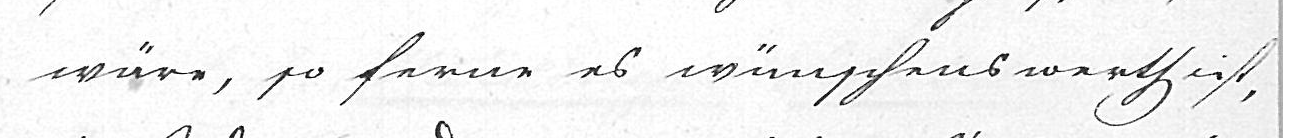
wäre, so ferne es wünschenswerth ist,
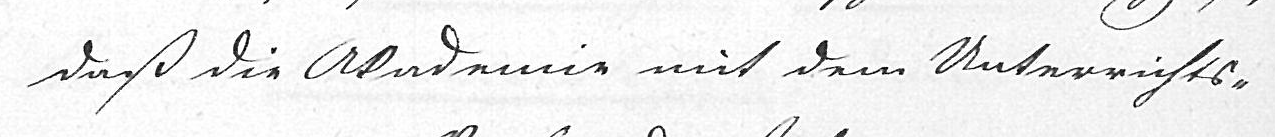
daß die Akademie mit dem Unterrichts-
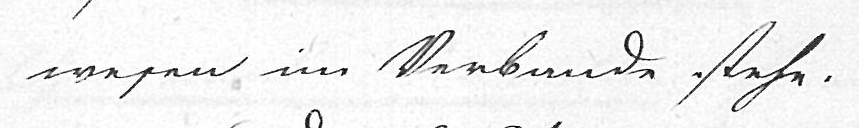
wesen im Verbande stehe.
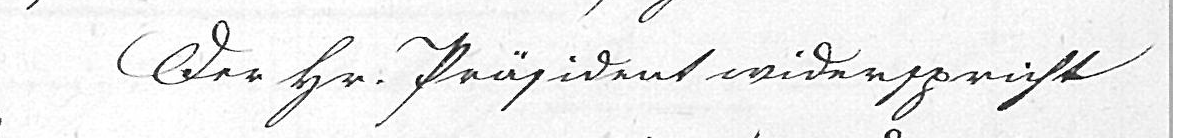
Der Hr. Präsident widerspricht
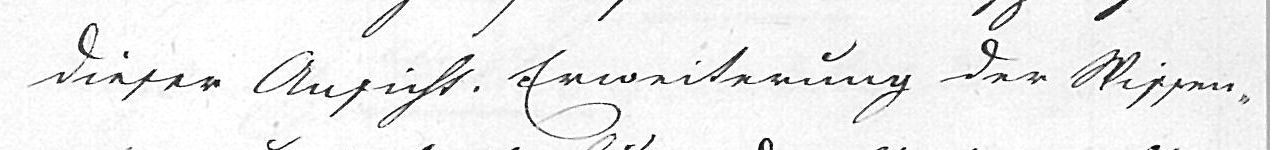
dieser Ansicht. Erweiterung der Wissen-
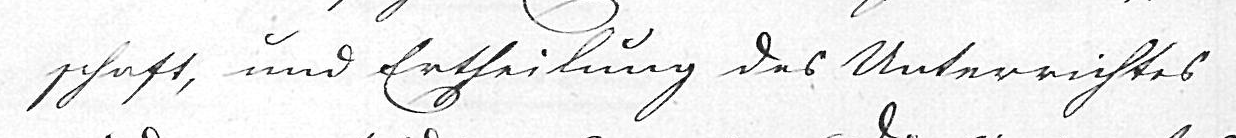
schaft, und Ertheilung des Unterrichtes
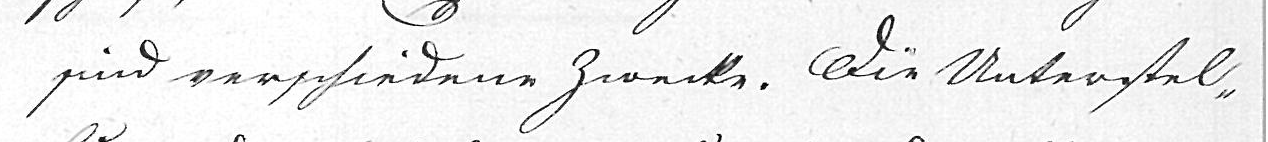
sind verschiedene Zwecke. Die Unterstel-
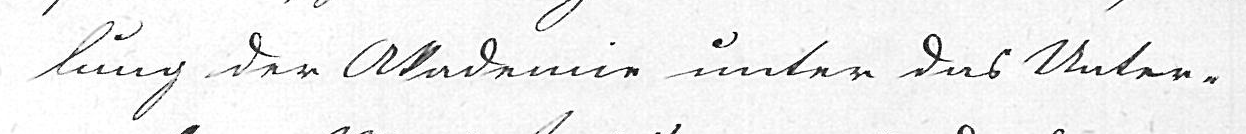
lung der Akademie unter das Unter-
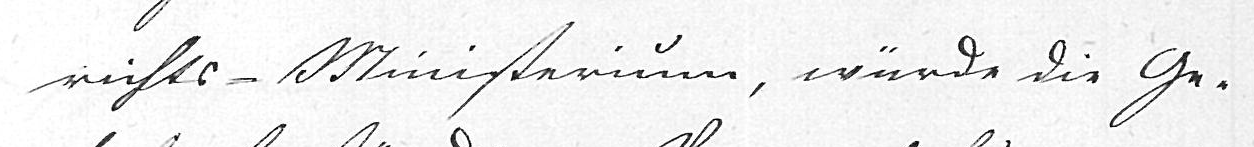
richts-Ministerium, würde die Ge-
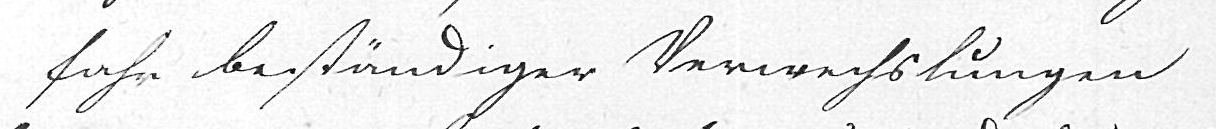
fahr beständinger Verwechslungen
